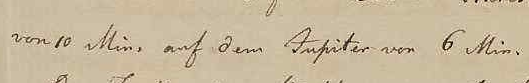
von 10 Min, auf dem Jupiter von 6 Min.
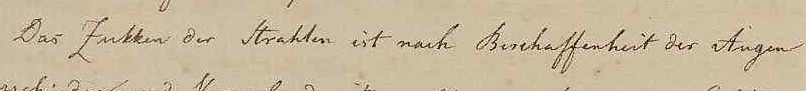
Das Zukken der Strahlen ist nach Beschaffenheit der Augen
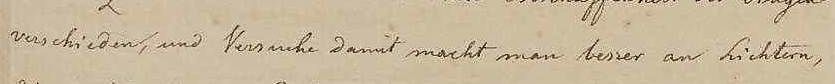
verschieden, und Versuche damit macht man besser an Lichtern,
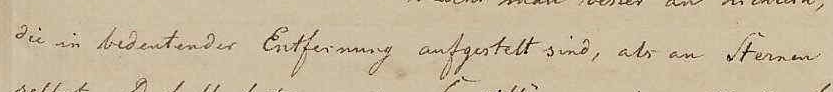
die in bedeutender Entfernung aufgestellt sind, als an Sternen
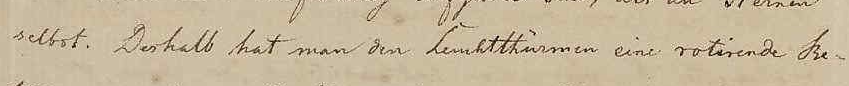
selbst. Deshalb hat man den Leuchtthürmen eine rotirende Be-
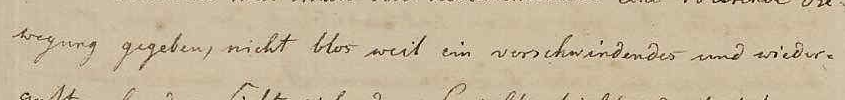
wegung gegeben, nicht blos weil ein verschwindendes und wieder-
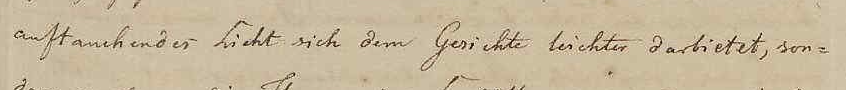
auftauchendes Licht sich dem Gesichte leichter darbietet, son-
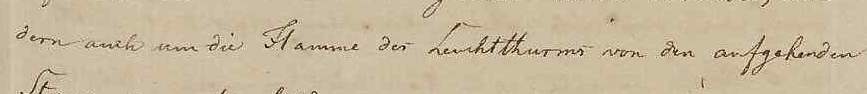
dern auch um die Flamme des Leuchtthurms von den aufgehenden
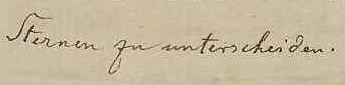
Sternen zu unterscheiden.
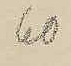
eben so,
